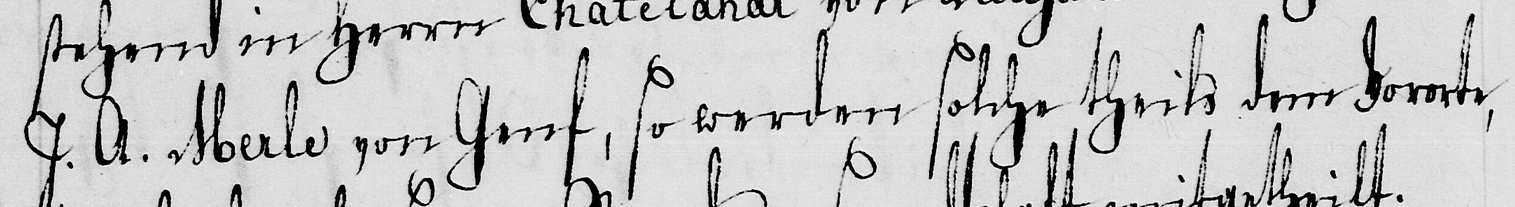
J. A. Merle von Genf, so werden solche theils dem Vorort¬
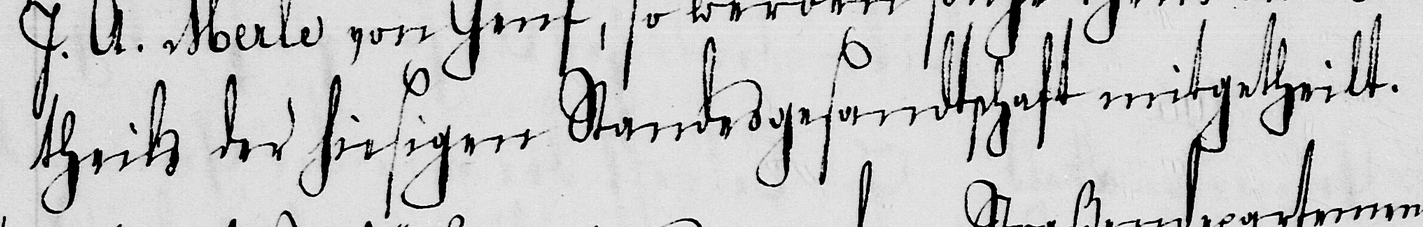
theils der hiesigen Standesgesandtschaft mitgetheilt.
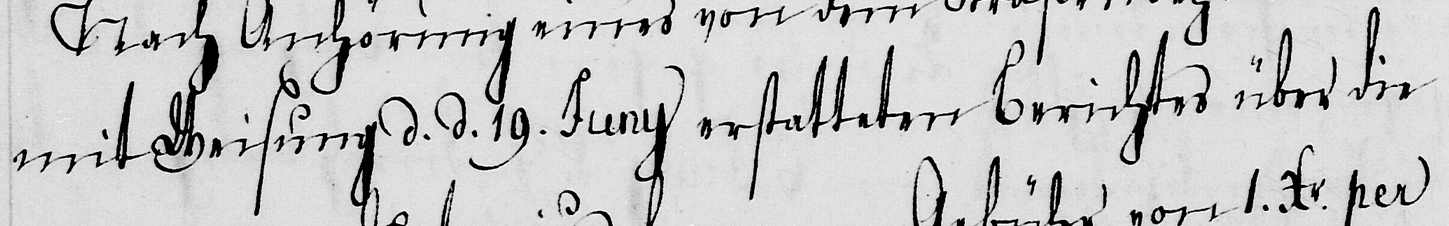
mit Weisung d. d. 19. Juny erstatteten Berichtes über die
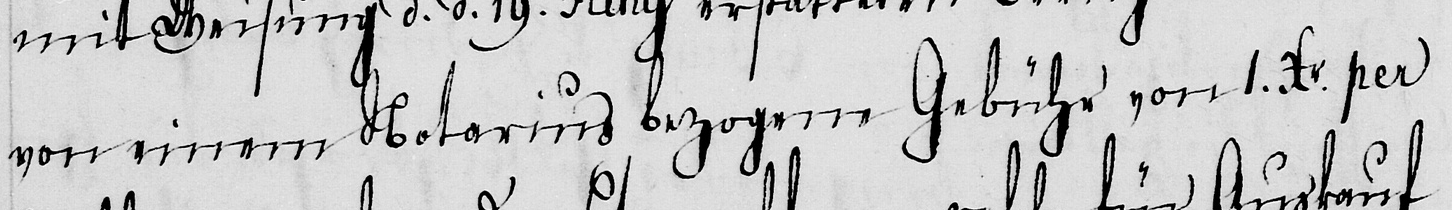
von einem Notarius bezogene Gebühr von 1. Xr. per
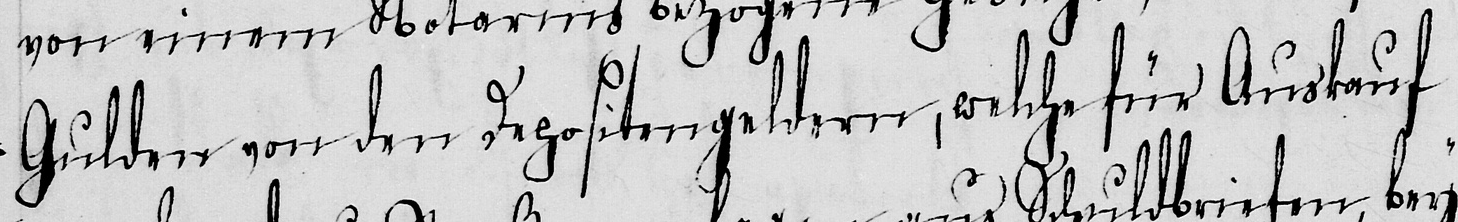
Gulden von den Depositengeldern, welche für Auskauf
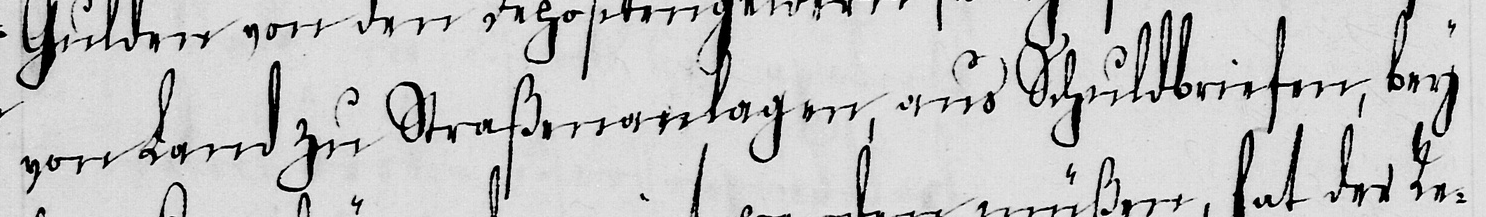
von Land zu Straßenanlagen, aus Schuldbriefen, bey
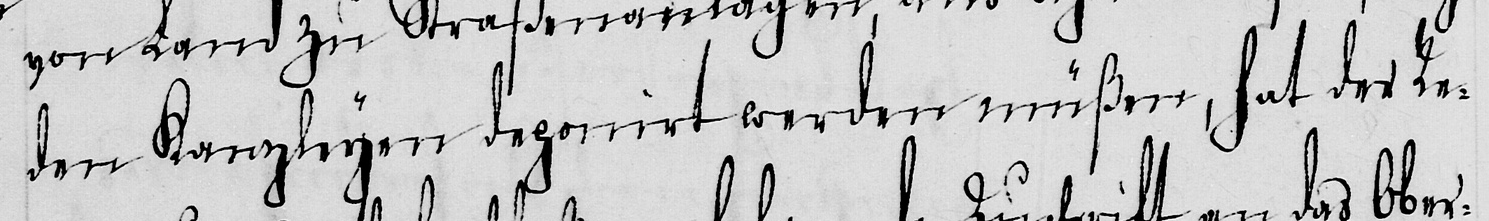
den Kanzleyen deponirt werden müßen, hat der Re¬
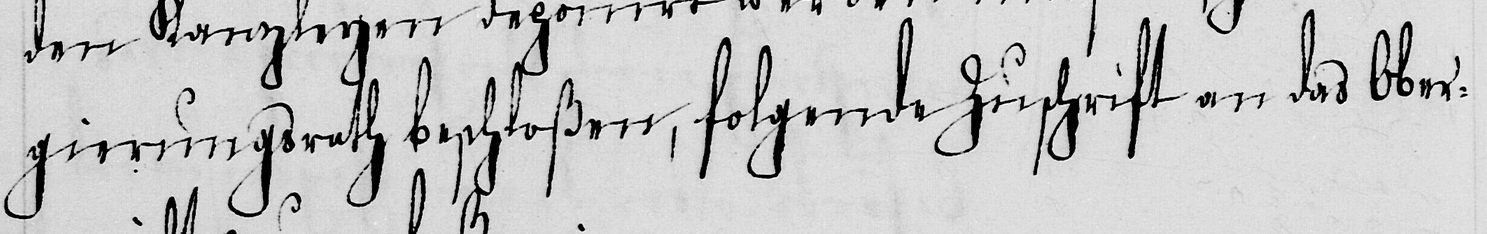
gierungsrath beschloßen, folgende Zuschrift an das Ober¬
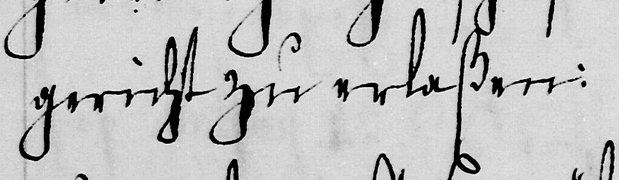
gericht zu erlaßen:
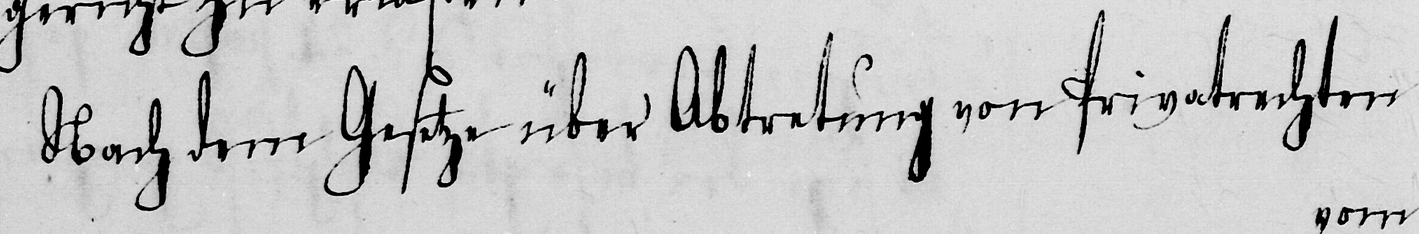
Nach dem Gesetze über Abtretung von Privatrechten
